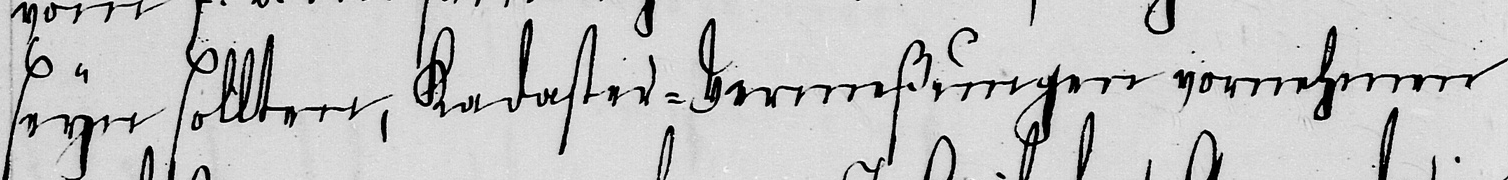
seyn sollten, Kadaster-Vermeßungen vornehmen
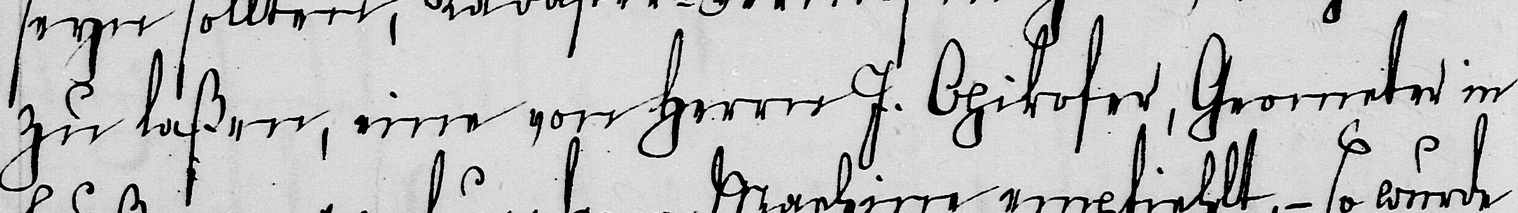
zu laßen, eine von Herrn J. Opikofer, Geometer in
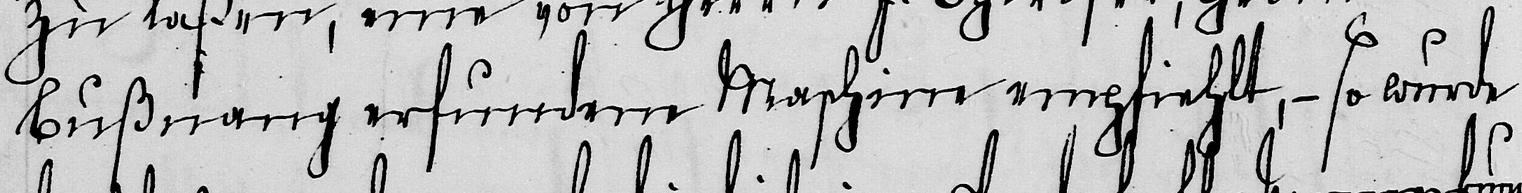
Bußnang erfundene Maschine empfiehlt, – so wurde
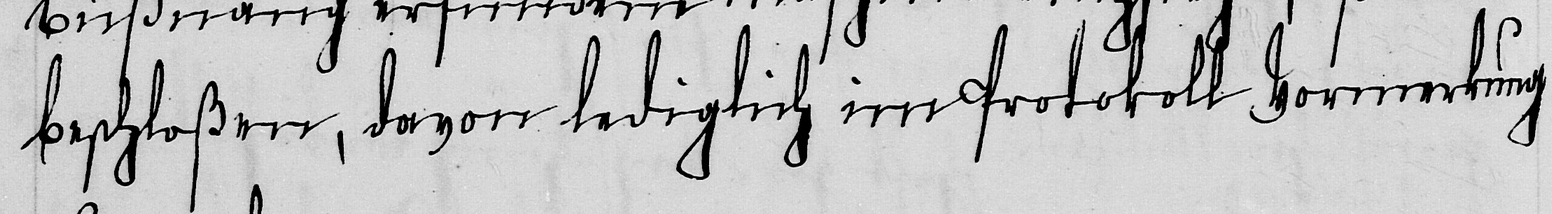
beschloßen, davon lediglich im Protokoll Vermerkung
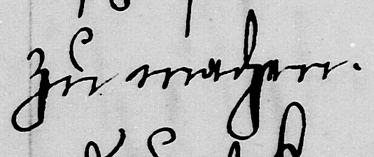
zu machen.
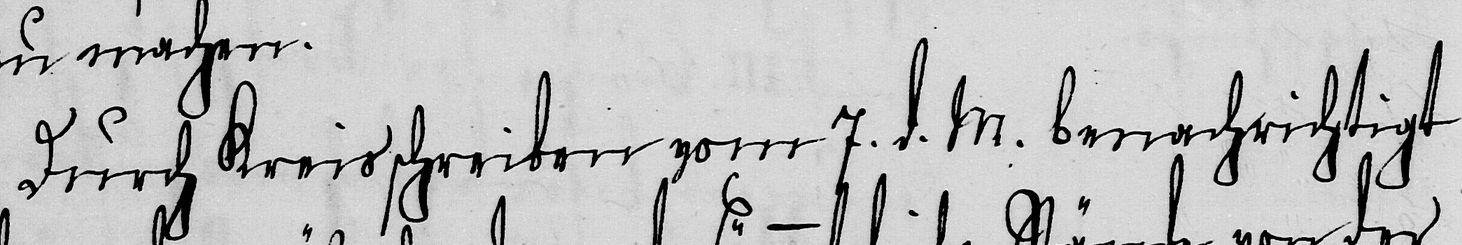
Durch Kreisschreiben vom 7. d. M. benachrichtigt
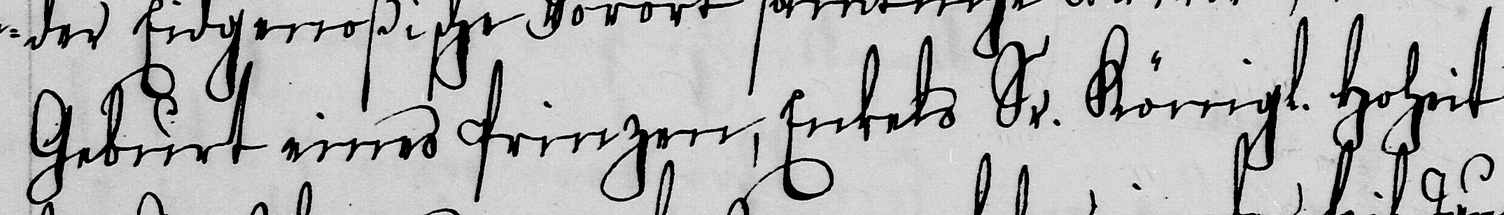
Geburt eines Prinzen, Enkels Sr. Königl. Hoheit
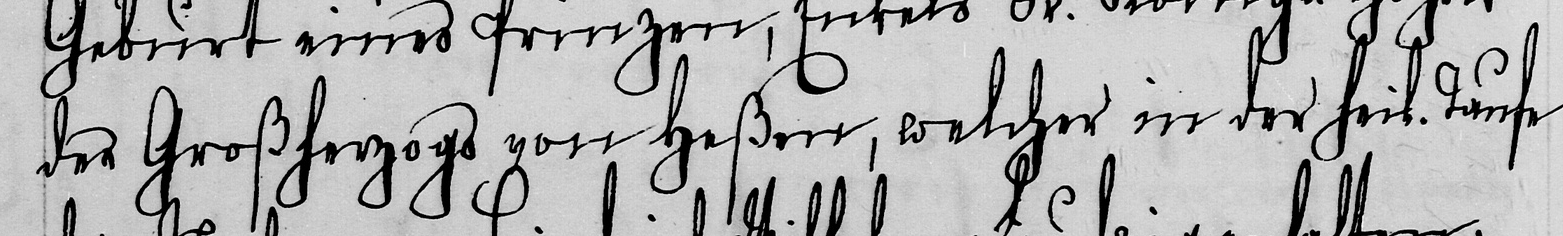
des Großherzogs von Heßen, welcher in der heil. Taufe
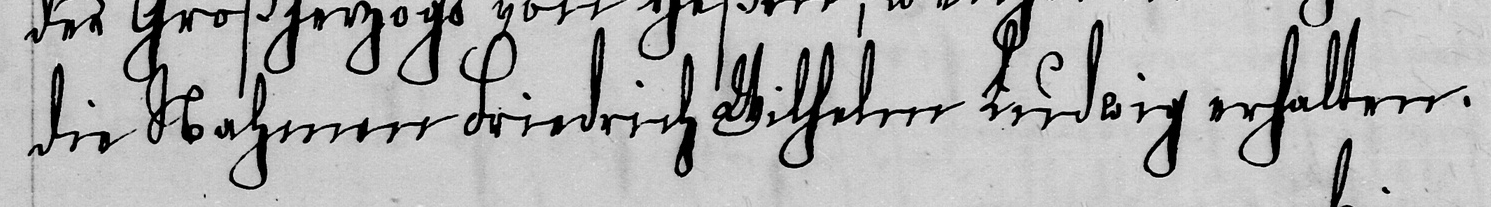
die Nahmen Friedrich Wilhelm Ludwig erhalten.
